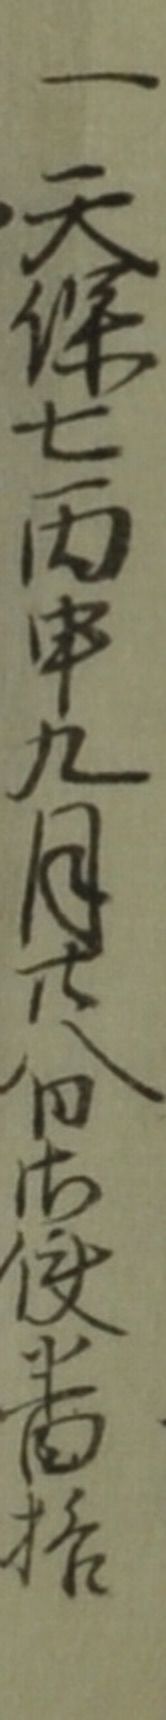一天保七丙九月廿八日御使番格
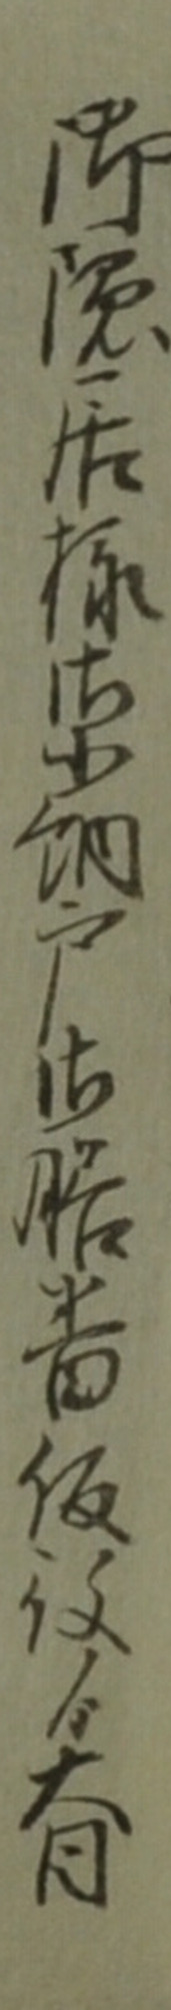御隠居様御小納戸御膳番仮役ゟ大目
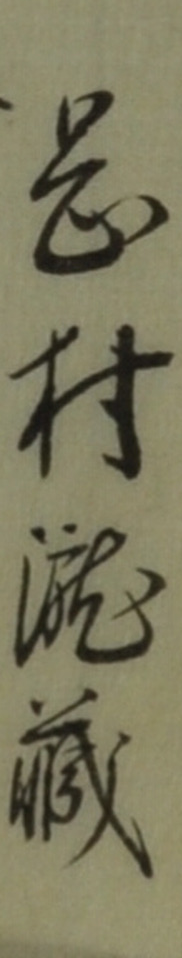岡村瀧蔵
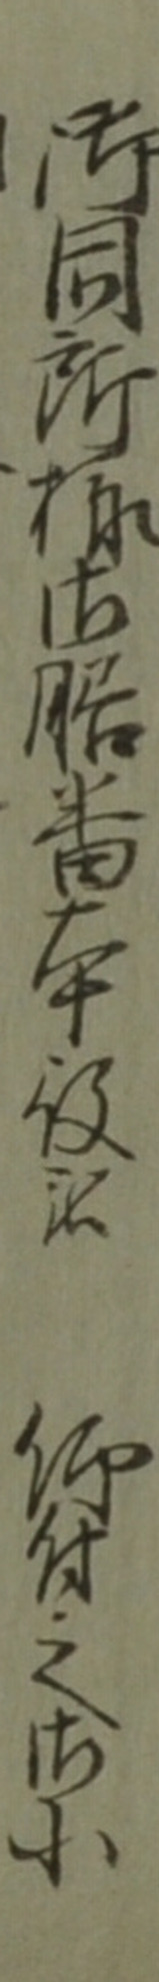御同所様御膳番本役被仰付之御小
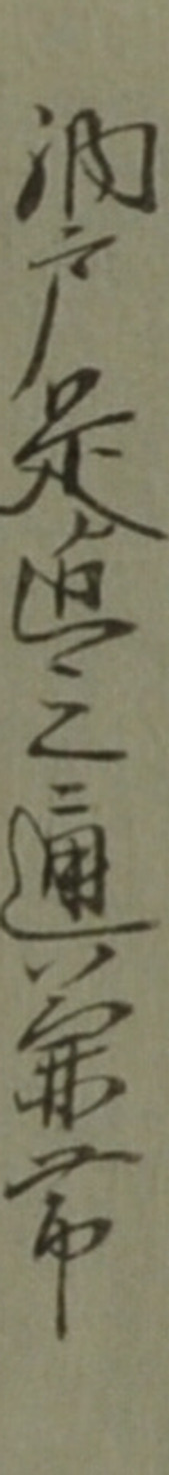納戸是迄之通兼帯
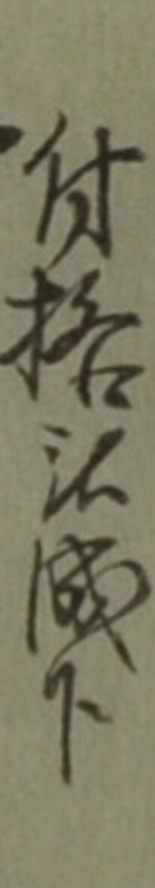付格被成下
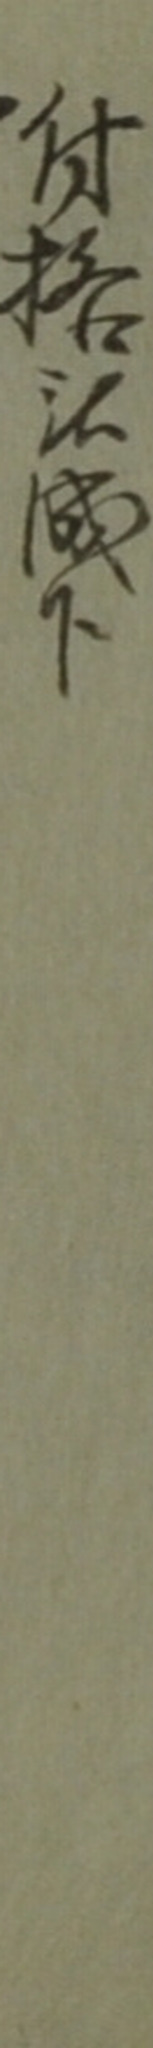付格被成下
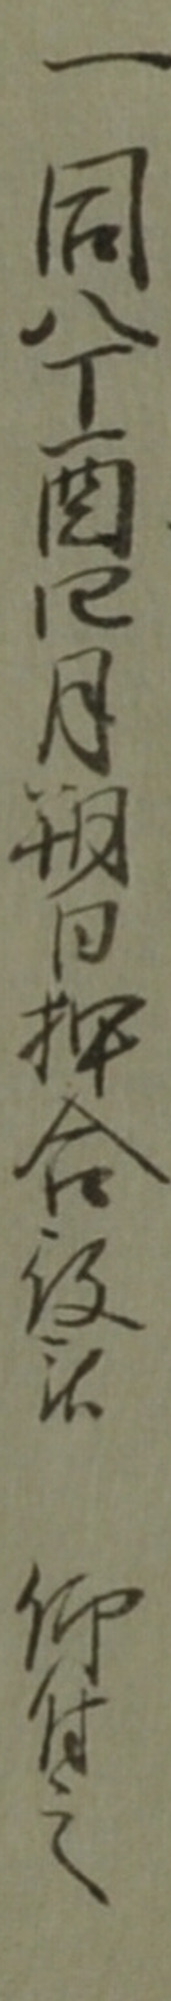一同八丁酉四月朔日押合役被仰付之
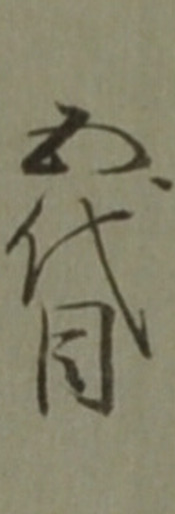五代目
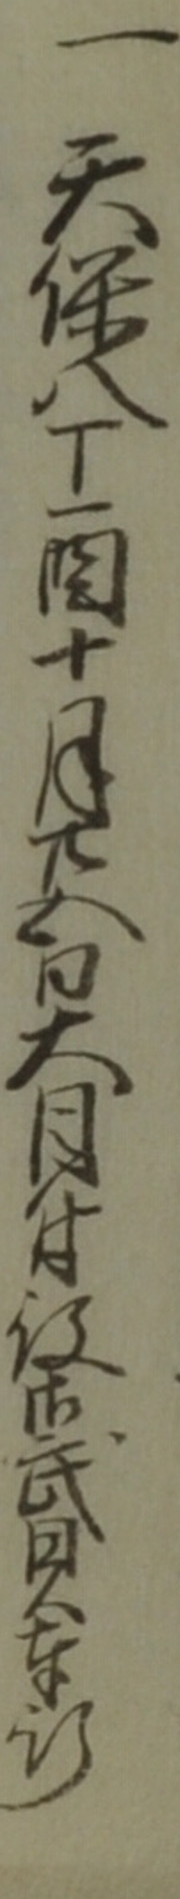一天保八丁酉十月廿五日大目付役御武具奉行
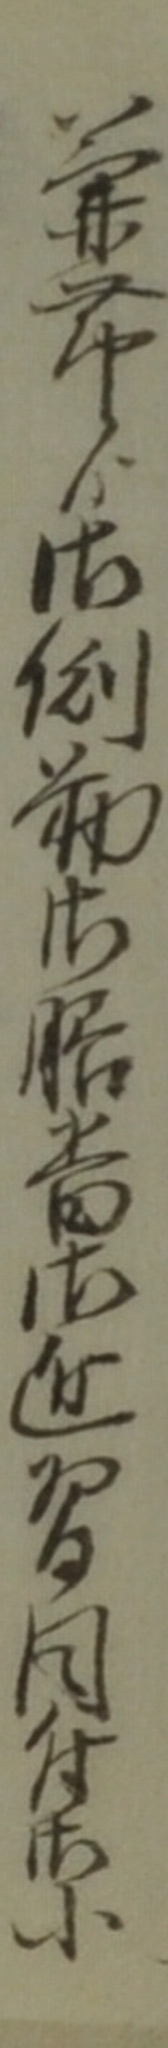兼帯ゟ御側勤御膳番御近習目付御小
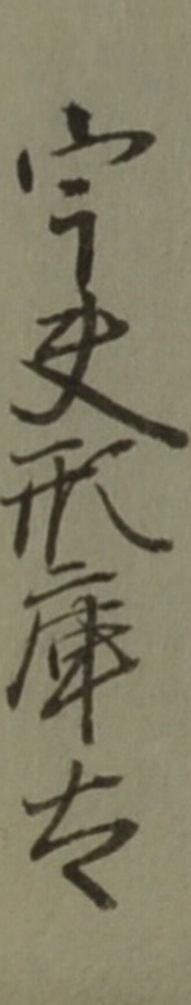宇夫形庫太
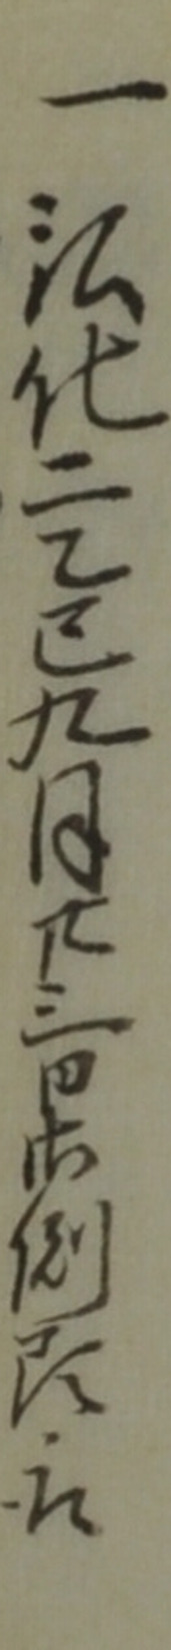一弘化二乙巳九月廿三日御側頭取
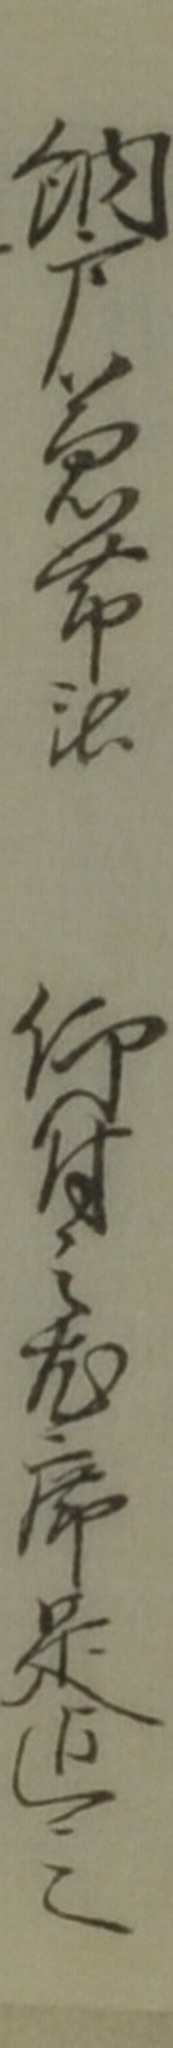納戸兼帯被仰付之尤席是迄之
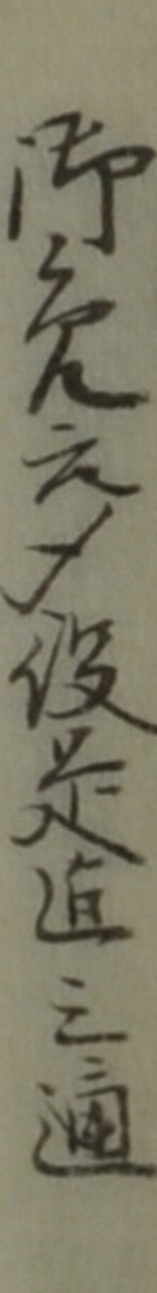御免元〆役是迄之通
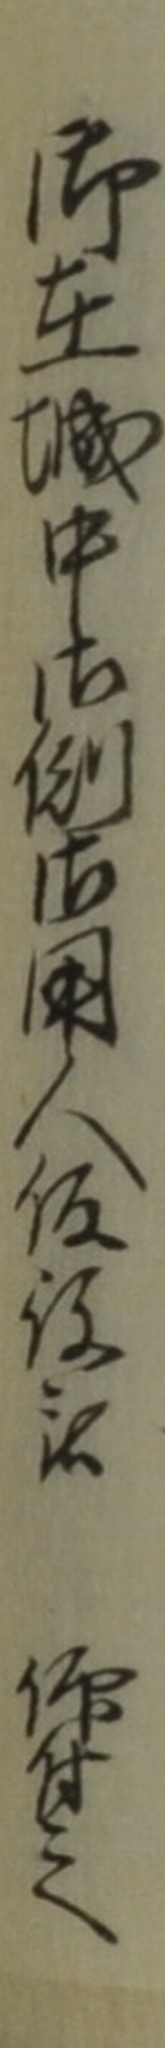御在城中御側御用人仮役被仰付之
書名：諸御役代々録（四）
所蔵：伊那市立高遠町図書館・合同会社AMANE
